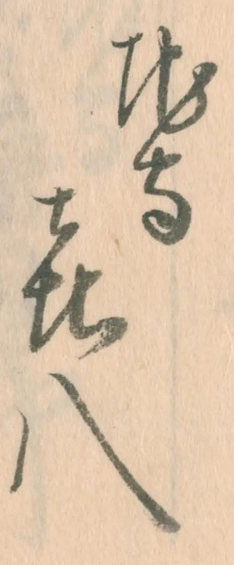地守喜八
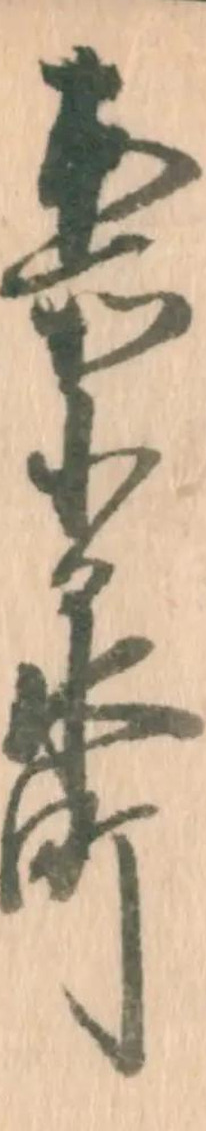本所小泉町

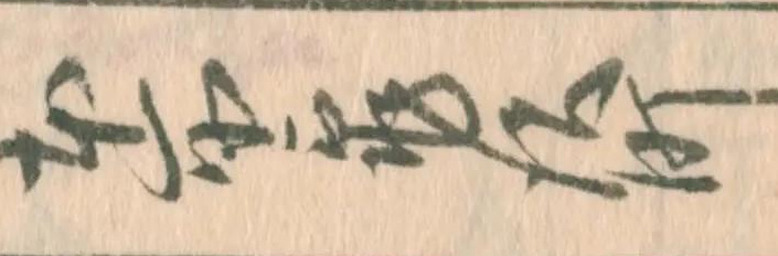本所亀沢町

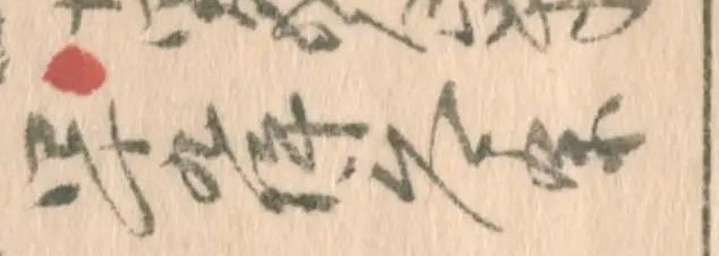四十九坪三合余
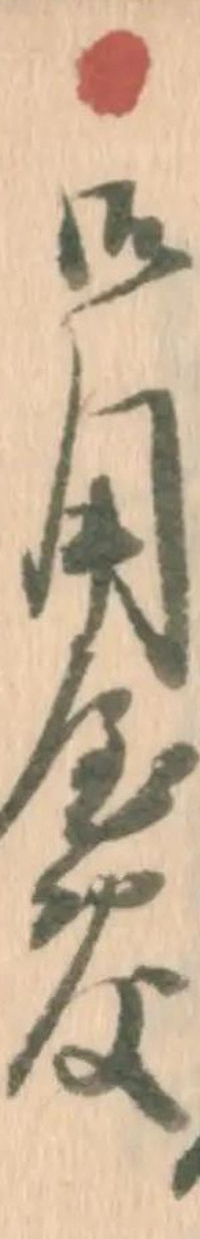●御用屋敷
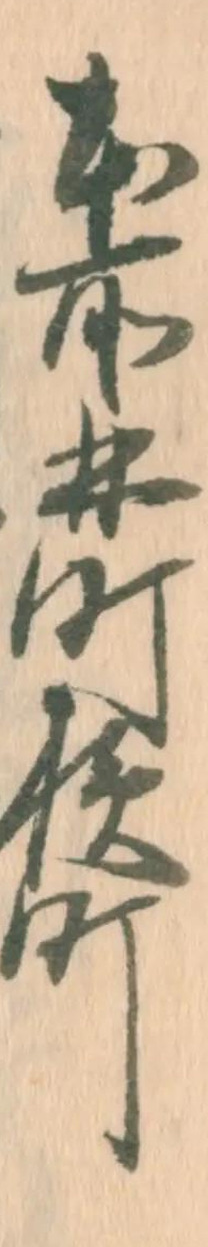本所林町横町

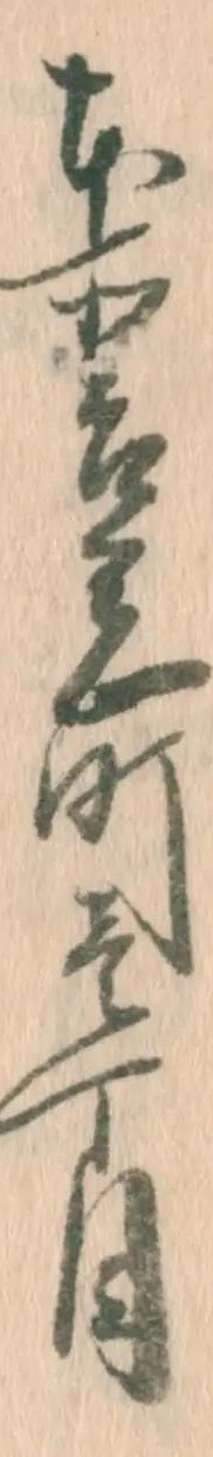本所吉岡町壱丁目
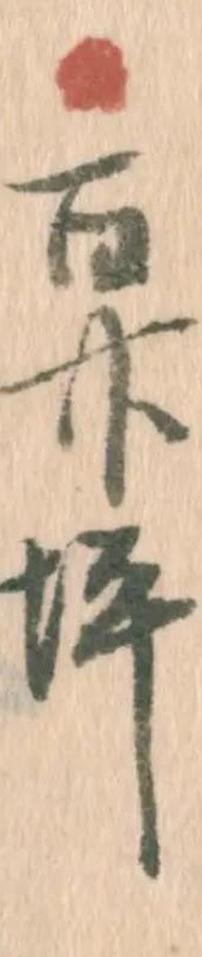●百廿坪

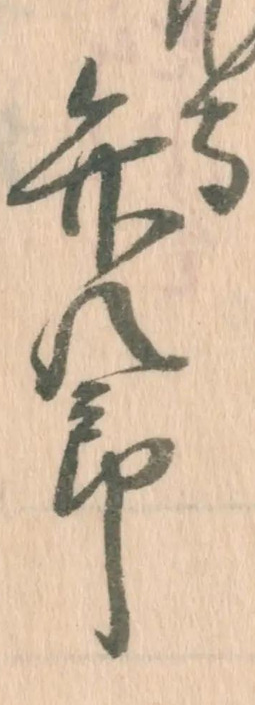弁八郎
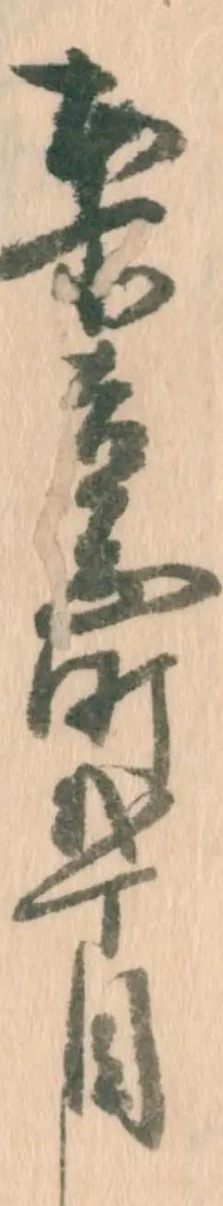本所吉岡町弐丁目

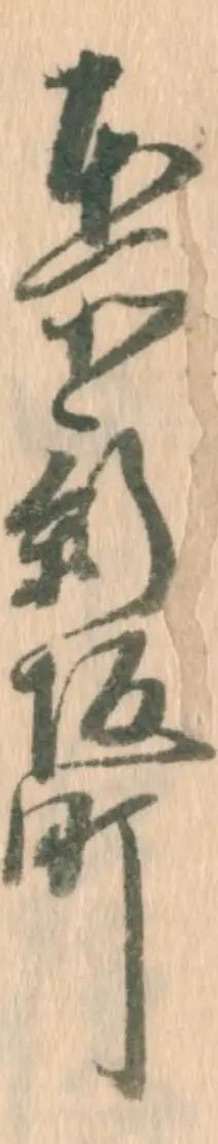本所新坂町

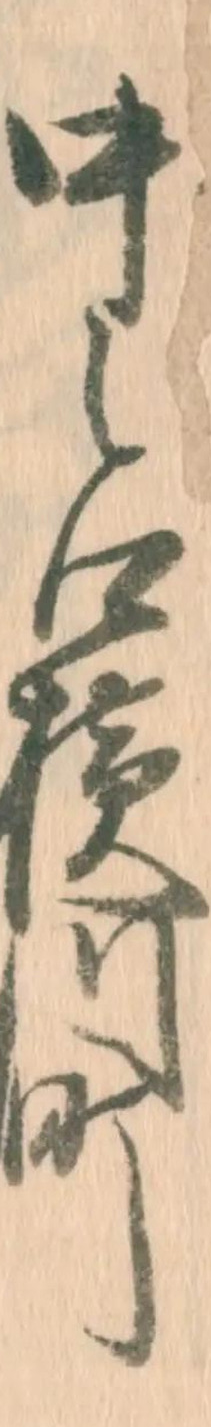中之郷横川町

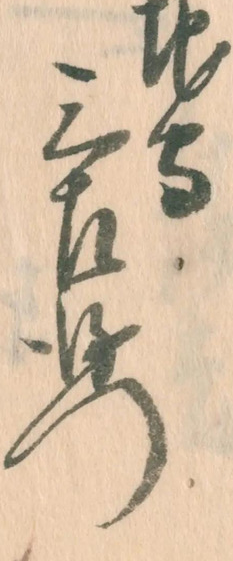三左衛門
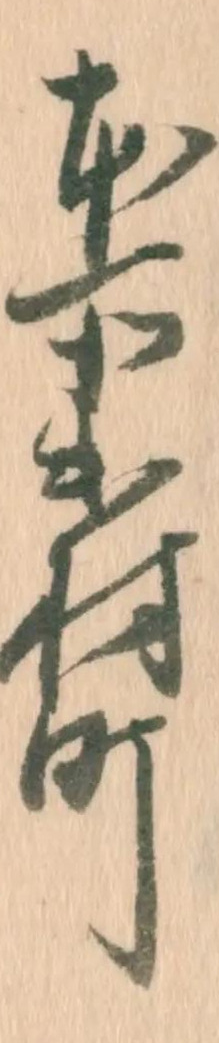本所出村町
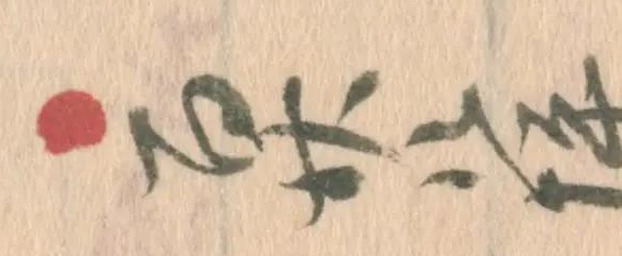●百廿八坪

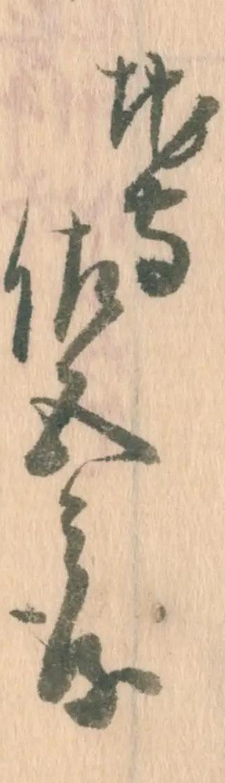佐五兵衛
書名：地震災書留 2巻. [1] 内表紙に「地震災書留　安政二卯年　但本所深川御用屋敷地代免除調」とあり
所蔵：国立国会図書館 National Diet Library, JAPAN
